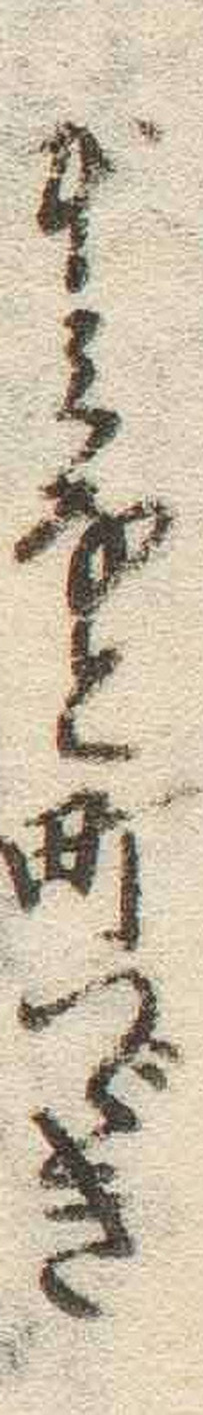本みなと町つゞき
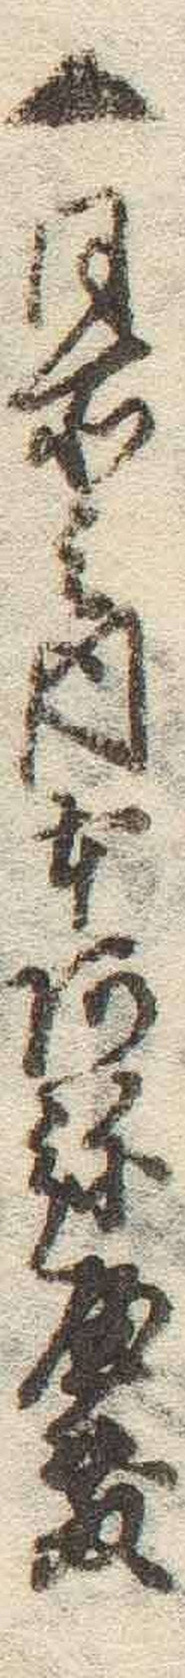▲同所之内本阿弥屋敷
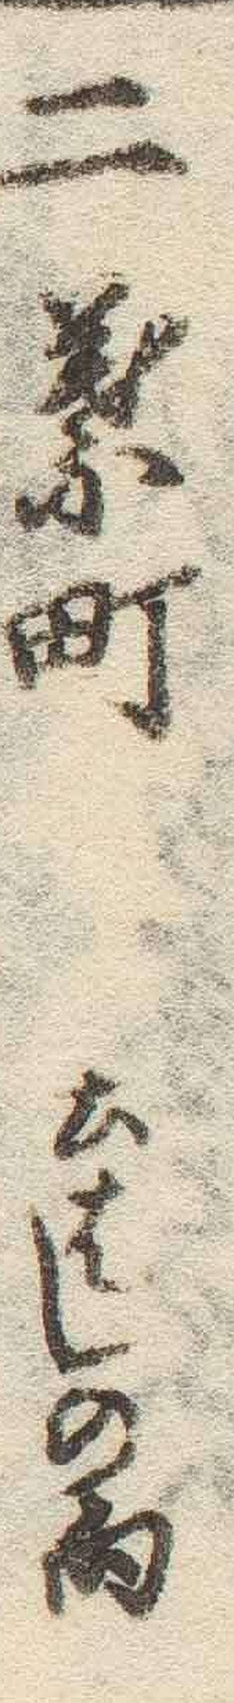二葉町土はしの向
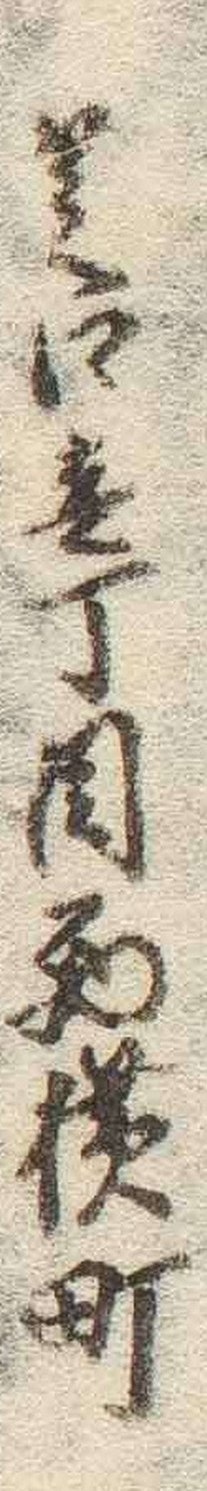芝口壱丁目西横町
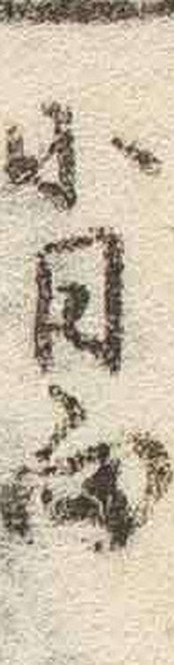小日向
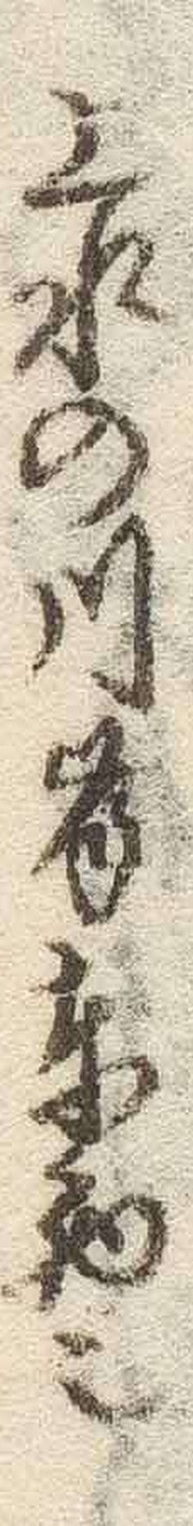上水の川岸東西也
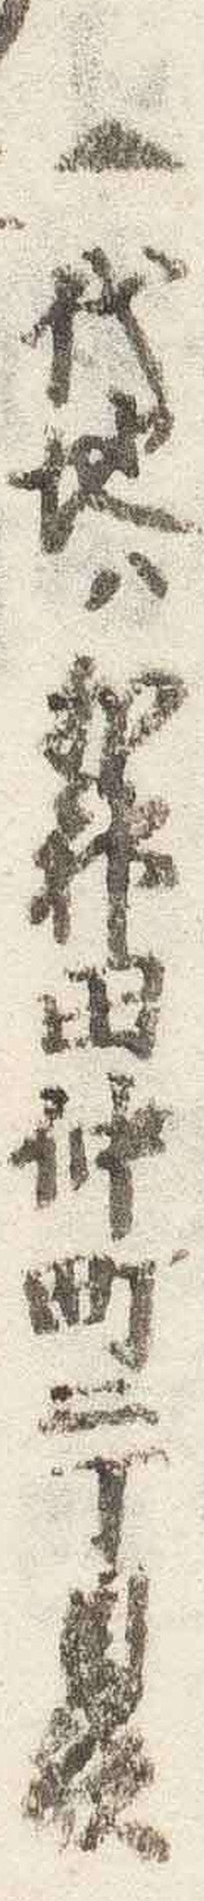▲代地は外神田仲町二丁目続
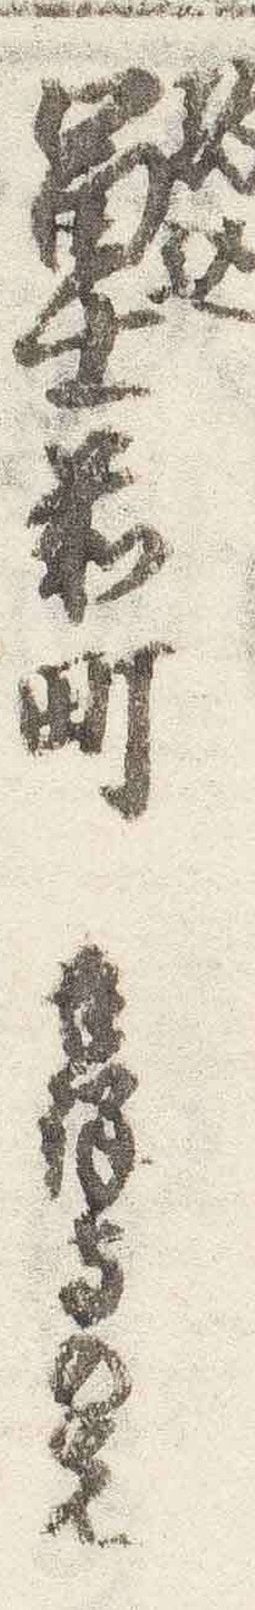富士前町吉祥寺の先
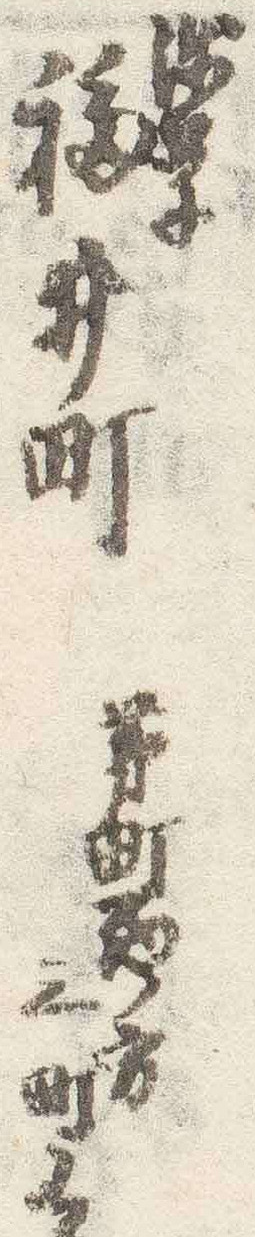福井町茅町西ノ方
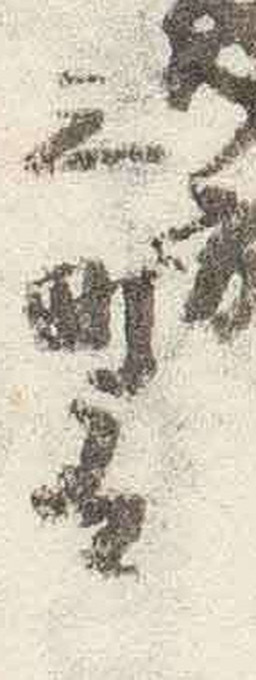三町有
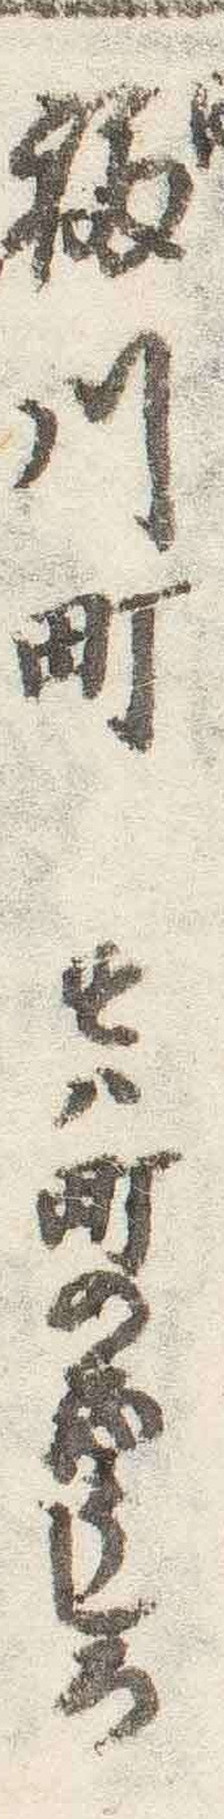福川町すは町の西うしろ
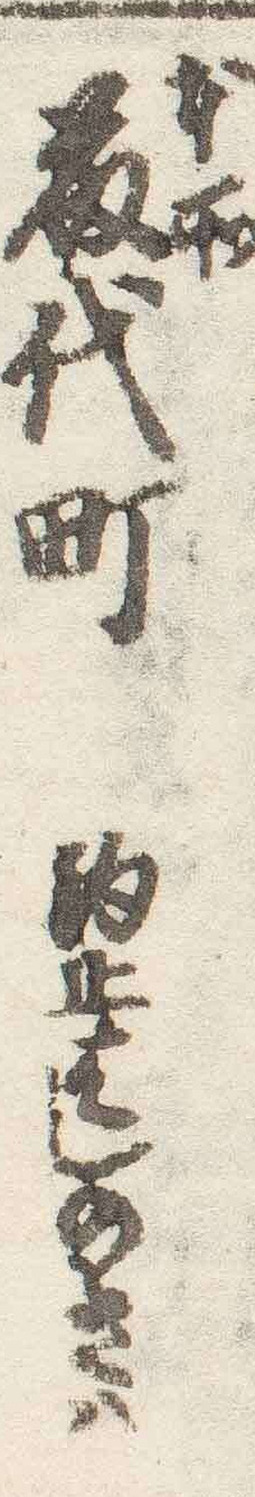藤代町駒止はしのきは
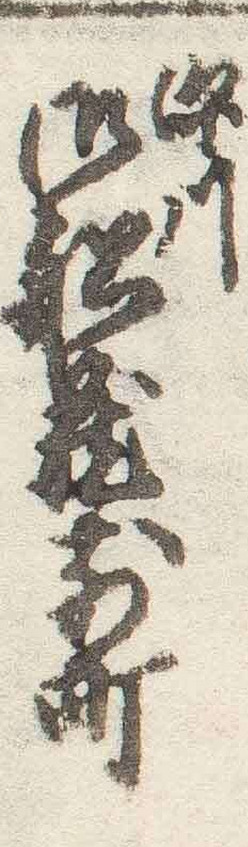御舩蔵前町
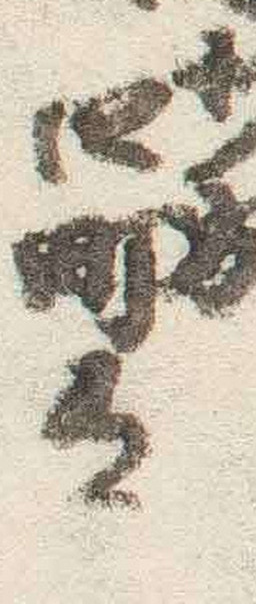四町有
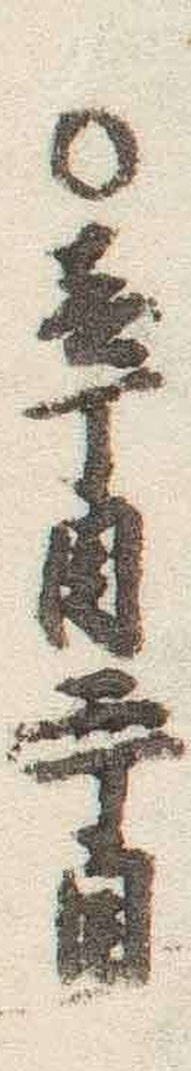○壱丁目二丁目
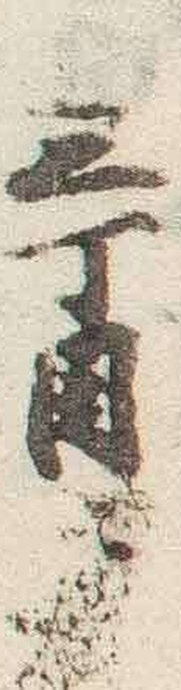三丁目
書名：江戸町独案内
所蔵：東京学芸大学附属図書館 国文学研究資料館
